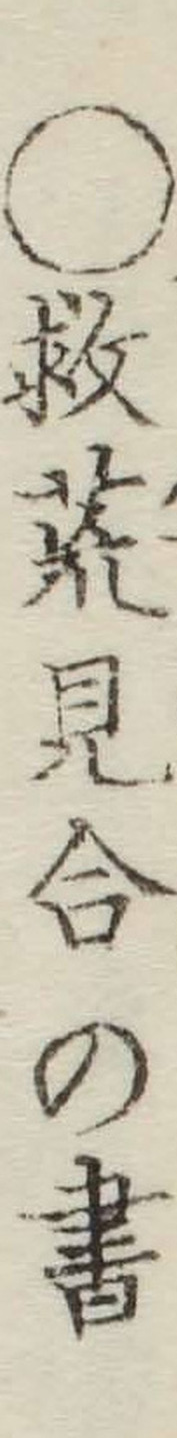○救荒見合の書
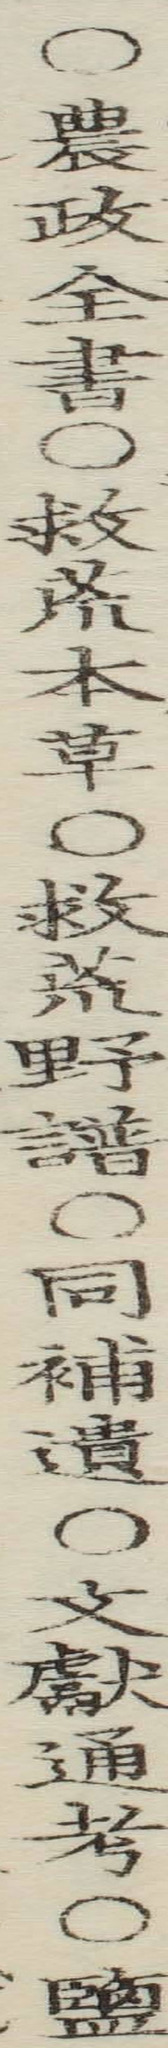○農政全書○救荒本草○救荒野譜○同補遺○文献通考○鹽
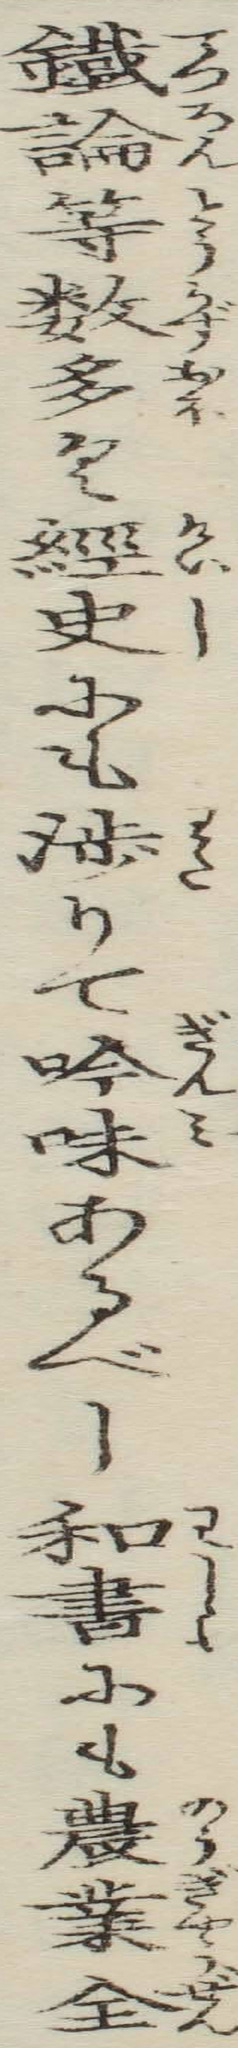鉄論等数多く経史にも渉りて吟味あるべし和書にも農業全

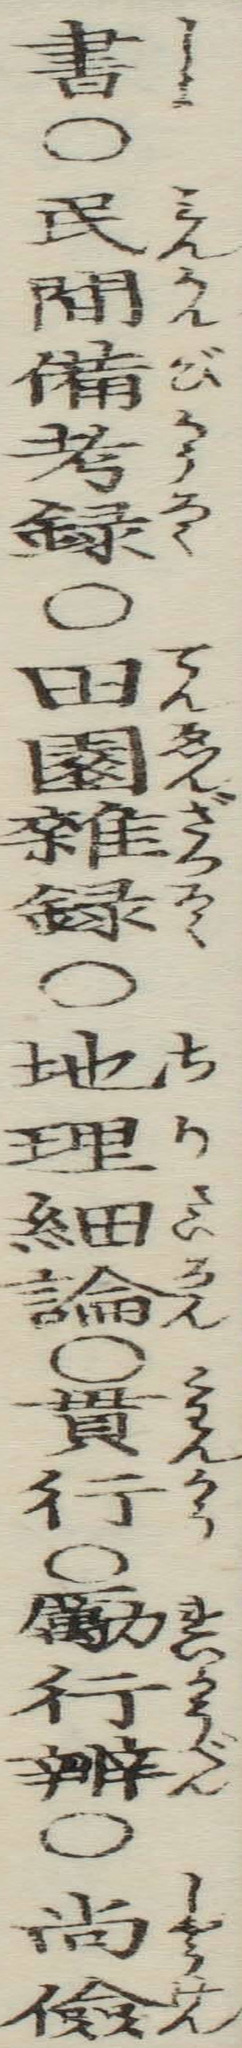書○民間備考録○田園雑録○地理細論○貫行○励行弁○尚倹
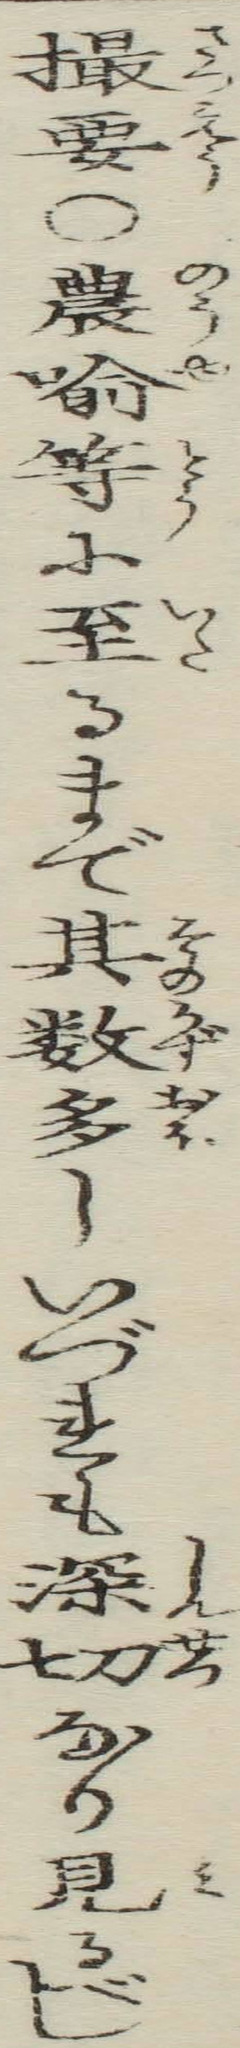撮要○農喩等に至るまで其数多しいづれも深切なり見るべし
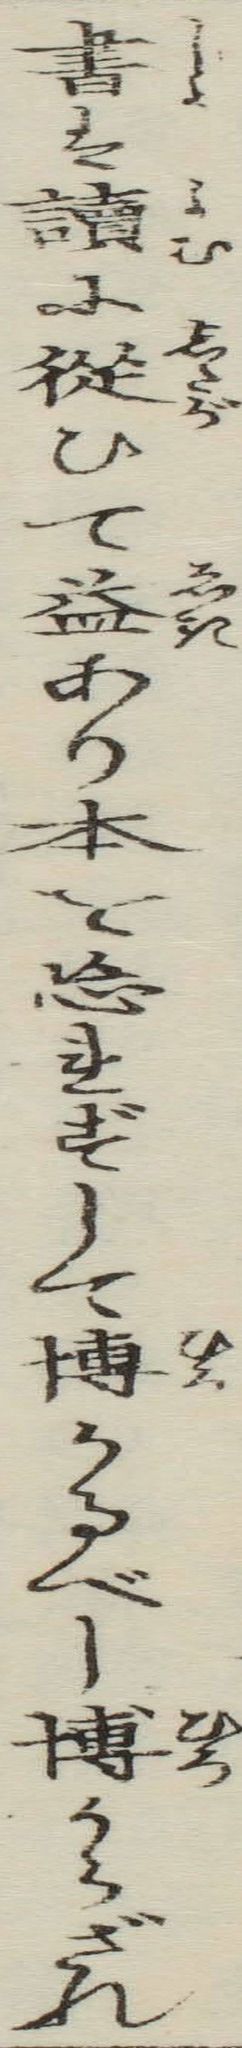書は読に従ひて益あり本を忘れずして博かるべし博からざれ
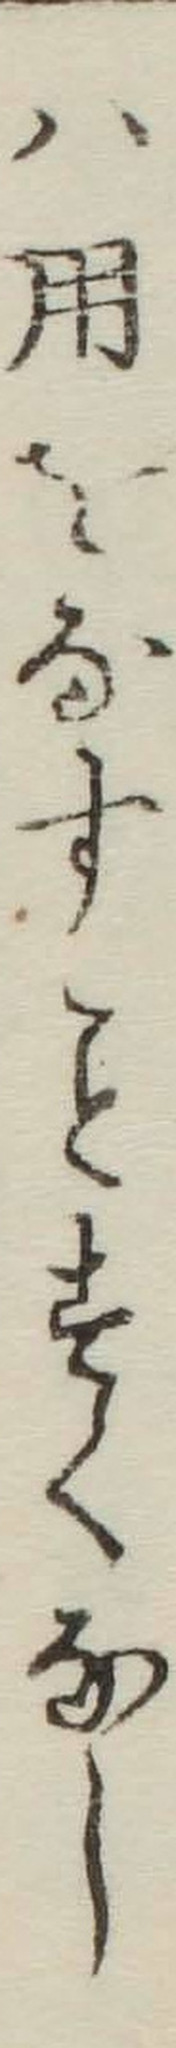は用をなすことすくなし
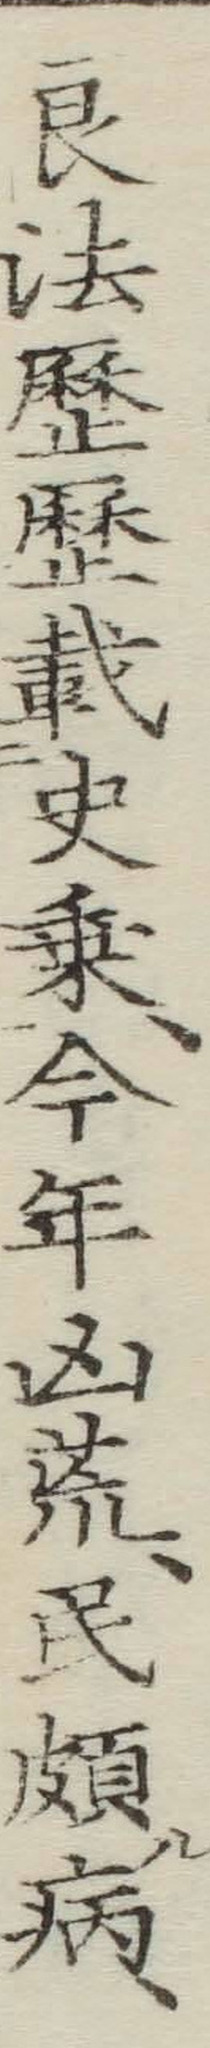良法歴歴載史乗、今年凶荒、民頗病、
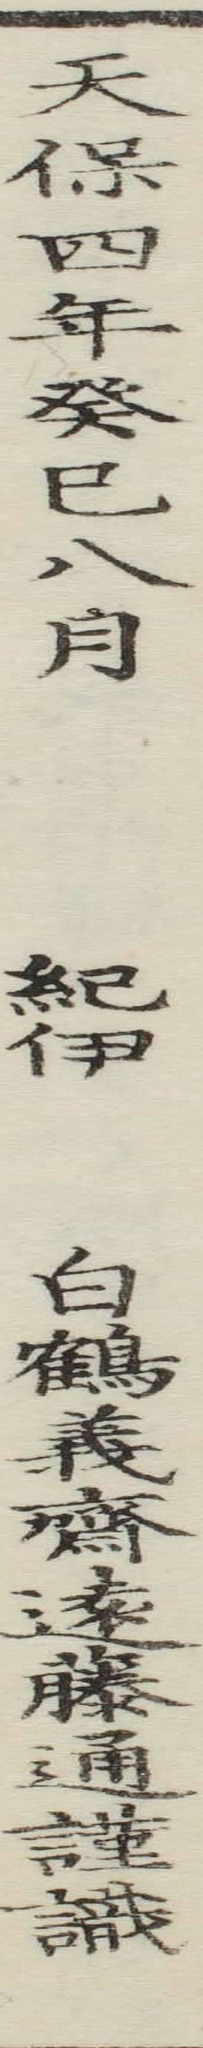天保四年癸巳八月紀伊白鶴義齋遠藤通謹識
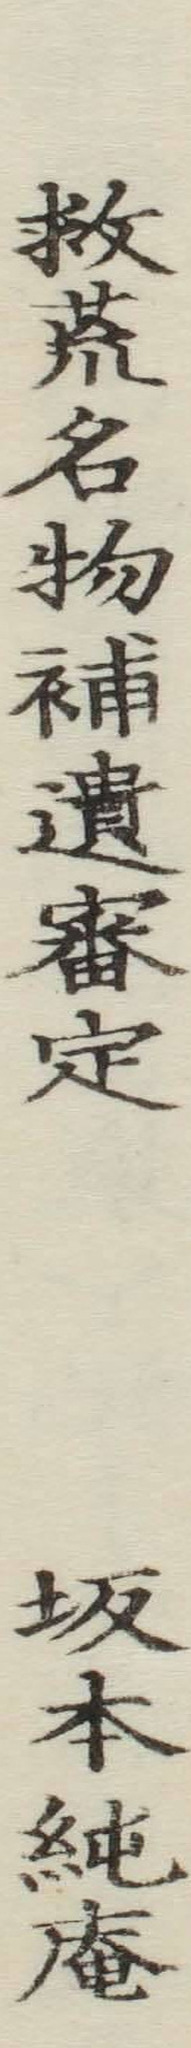救荒名物補遺審定坂本純庵
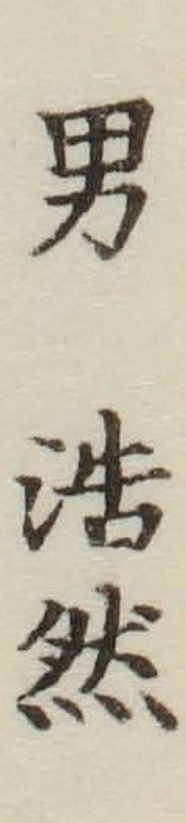男浩然

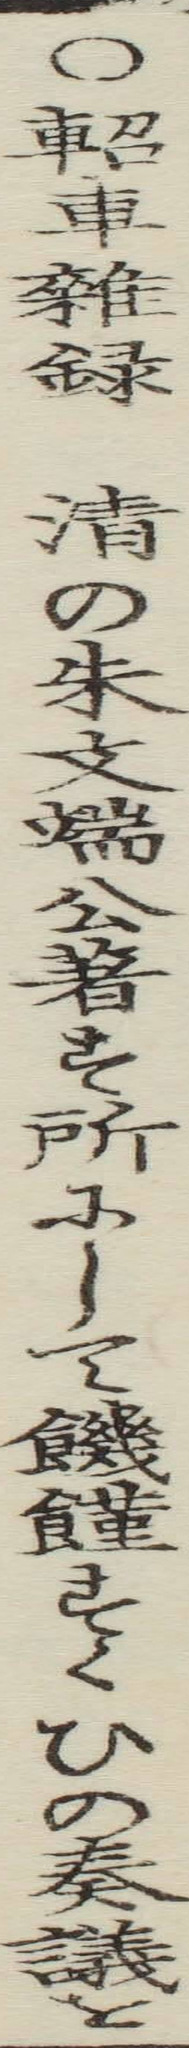○軺車雑録清の朱文端公著す所にして饑饉すくひの奏議を
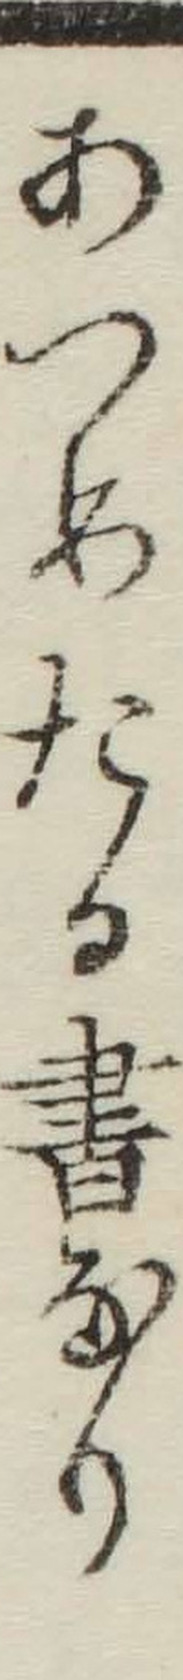あつめたる書なり
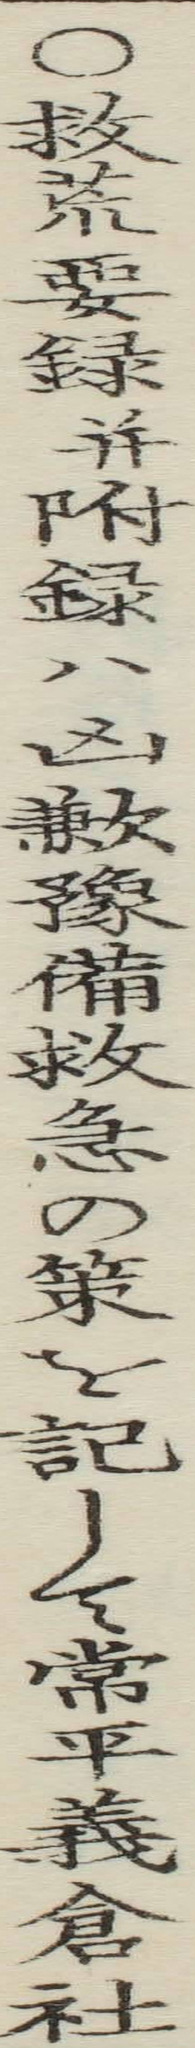○救荒要録并附録は凶歉予備救急の策を記して常平義倉社
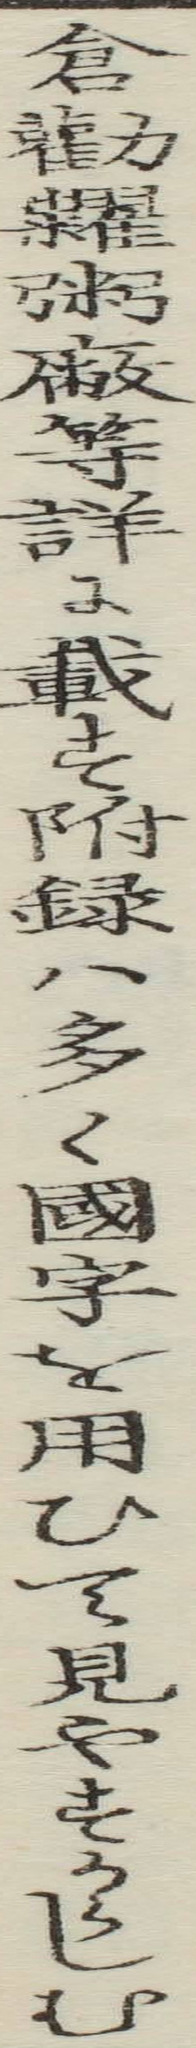倉勧糶粥廠等詳に載す附録は多く国字を用ひて見やすからしむ
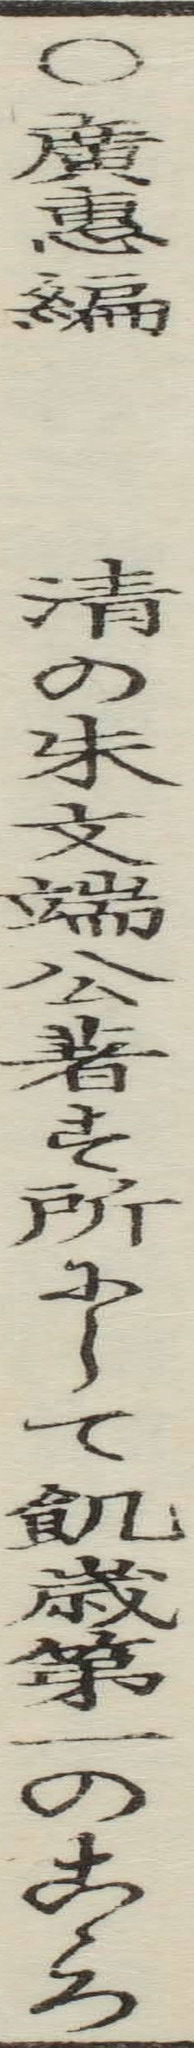○広恵編清の朱文端公著す所にして飢歳第一のこゝろ
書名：救荒便覧
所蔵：国文学研究資料館
